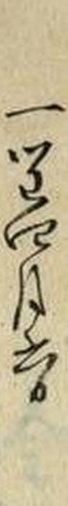一閏四月六日
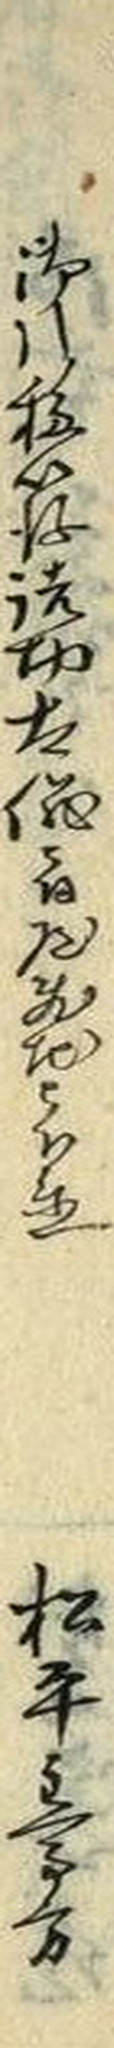御引移以後詰切太儀ニ付屋敷地被下置松平主馬方
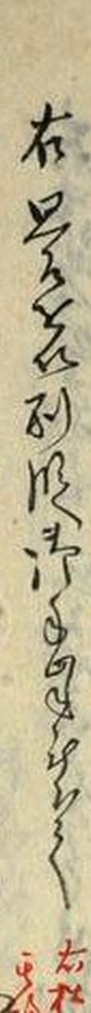右思召を以別段御手自被下之同人
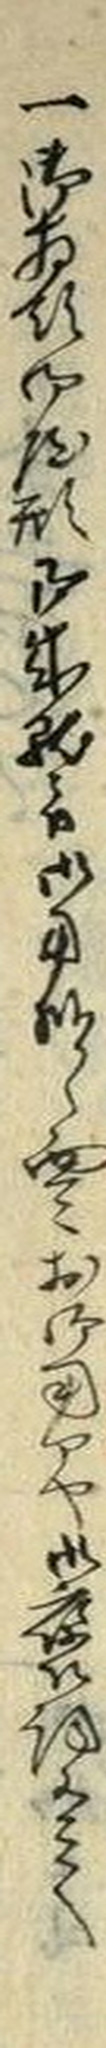一御拝領御屋形御成就ニ付御用掛り之面々於御用部や御褒詞有之
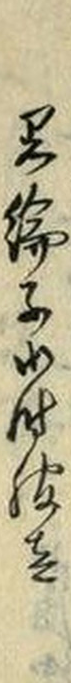黒綸子御時服壱
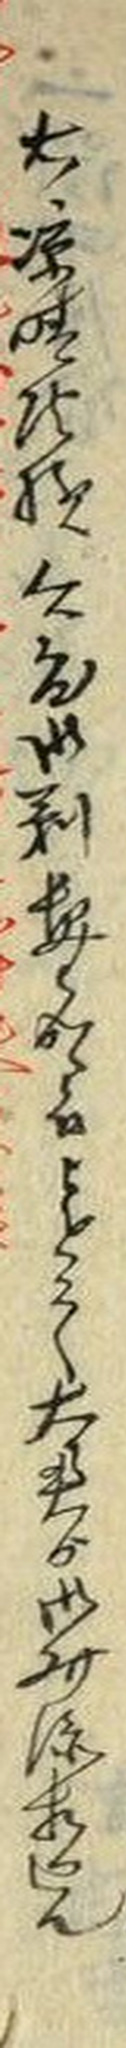右涼晴院様へ今度御剃髪被成候ニ付被進之大奥ゟ文添相廻ㇽ

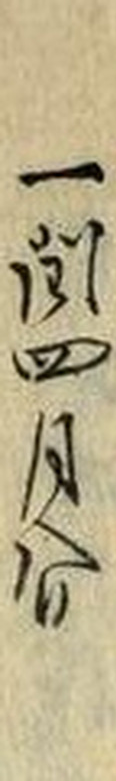一閏四月八日
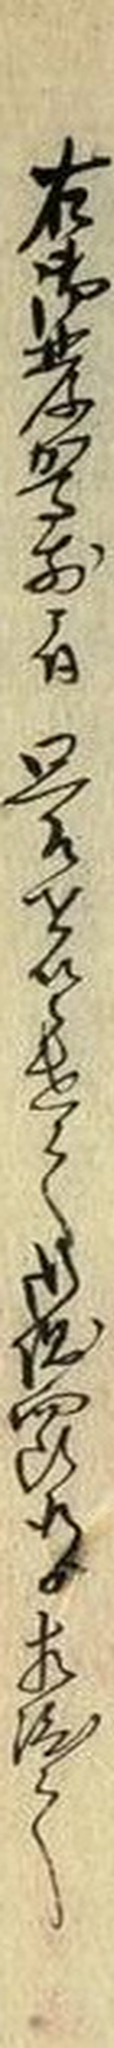右御発駕前ニ付思召を以被遣之御側向頭取ゟ相渡之
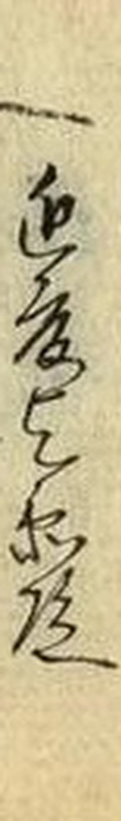近藤与兵衛殿
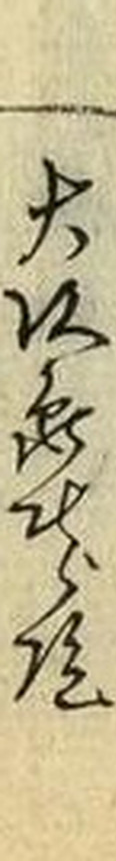大沢亀次郎殿
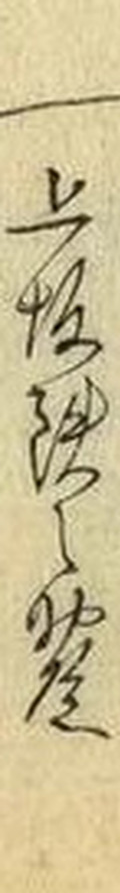上坂鉄之助殿
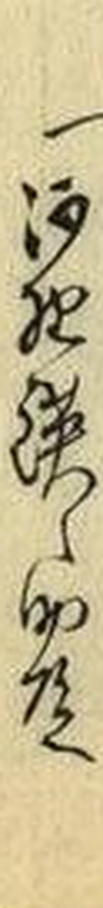河野鍈之助殿
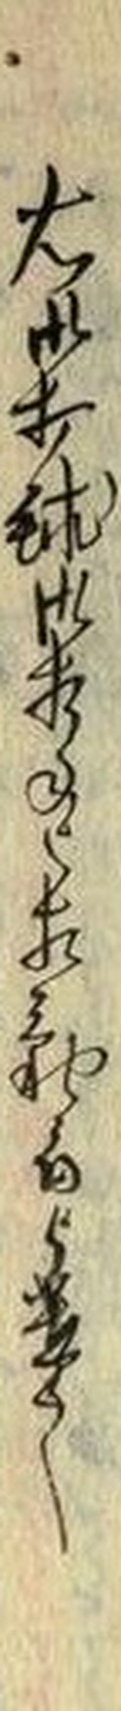右御打毬御相手被相勤候ニ付被遣之
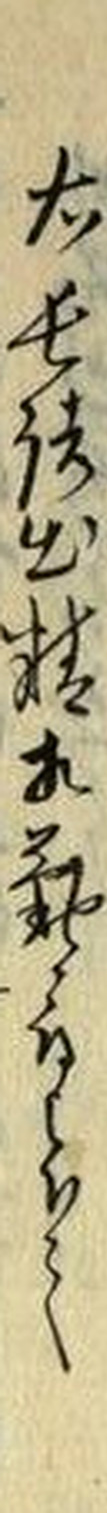右長詰出精相勤候ニ付被下之
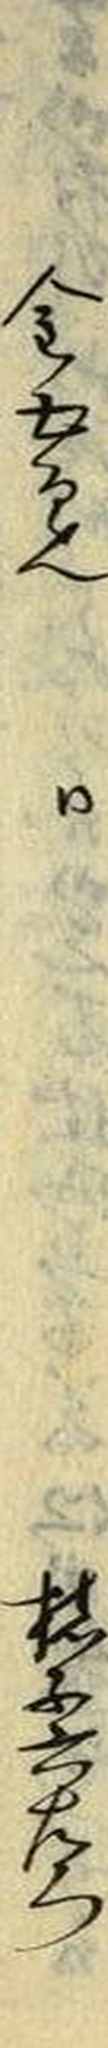金五百疋同猪子六左衛門
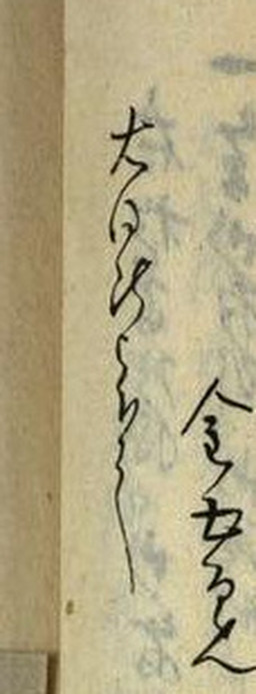右同断被下之
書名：少傅日録抄（斉善付側向頭取日記、江戸并道中、初入在国、逝去後…
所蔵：福井県文書館 Fukui Prefectural Archives
